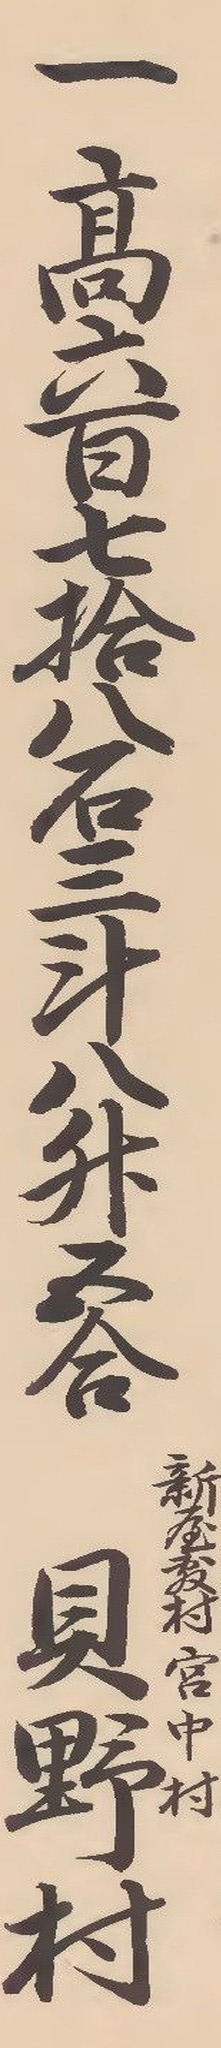一高六百七拾八石三斗八升五合貝野村
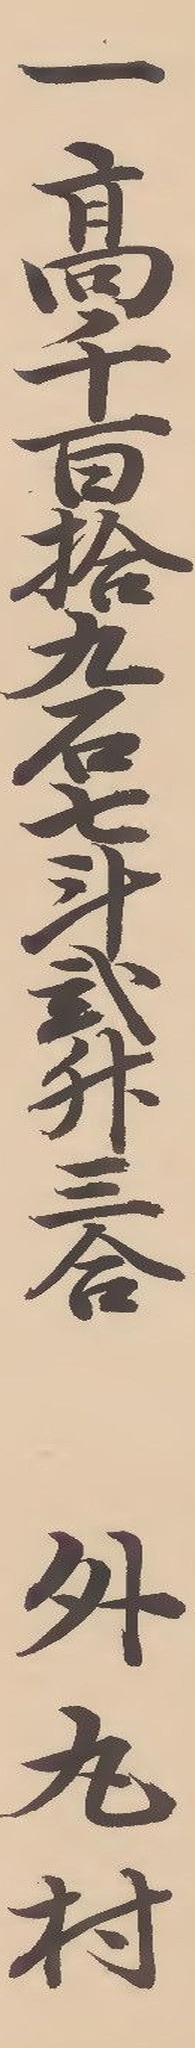一高千百拾九石七斗弐升三合外丸村
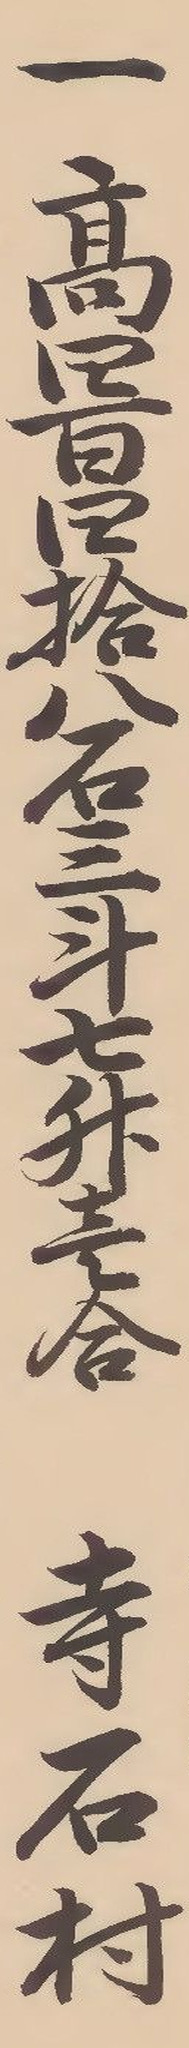一高四百四拾八石三斗七升壱合寺石村
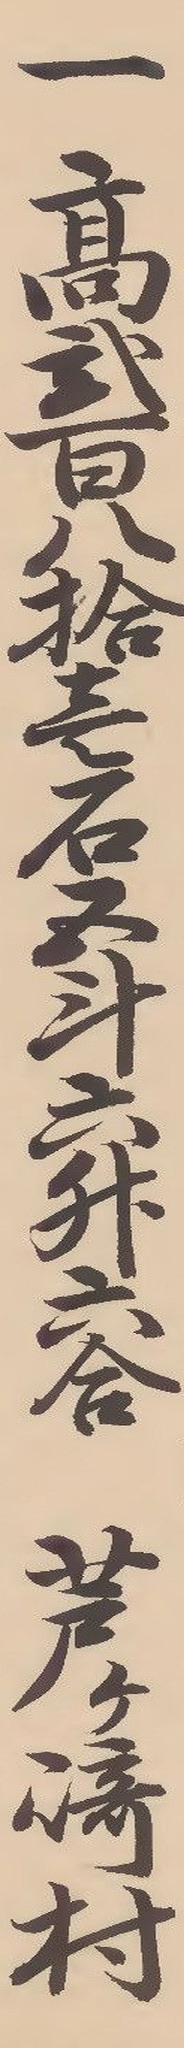一高弐百八拾壱石五斗六升六合芦ヶ崎村
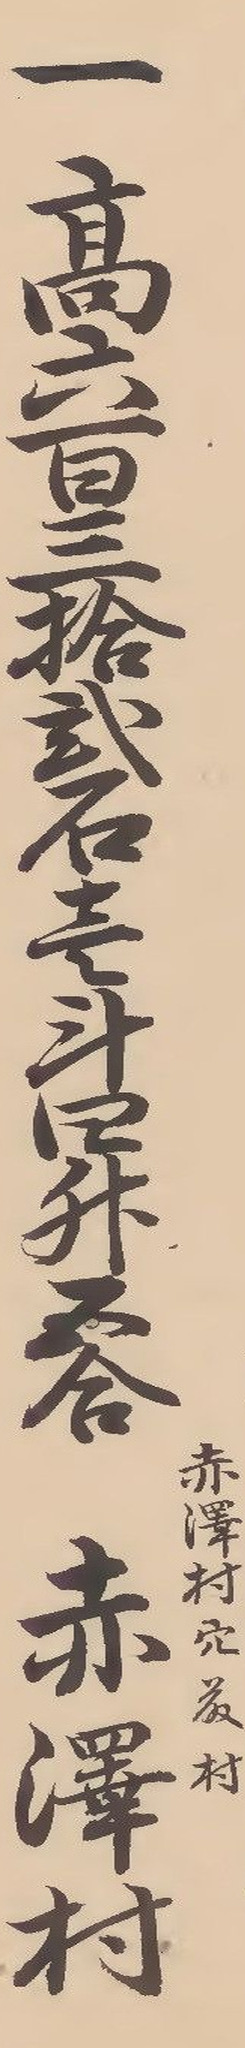一高六百三拾弐石壱斗四升五合赤沢村

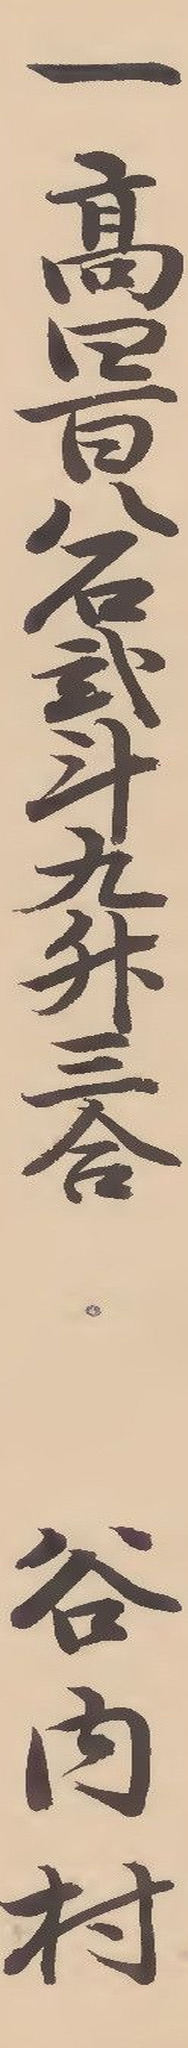一高四百八石弐斗九升三合谷内村
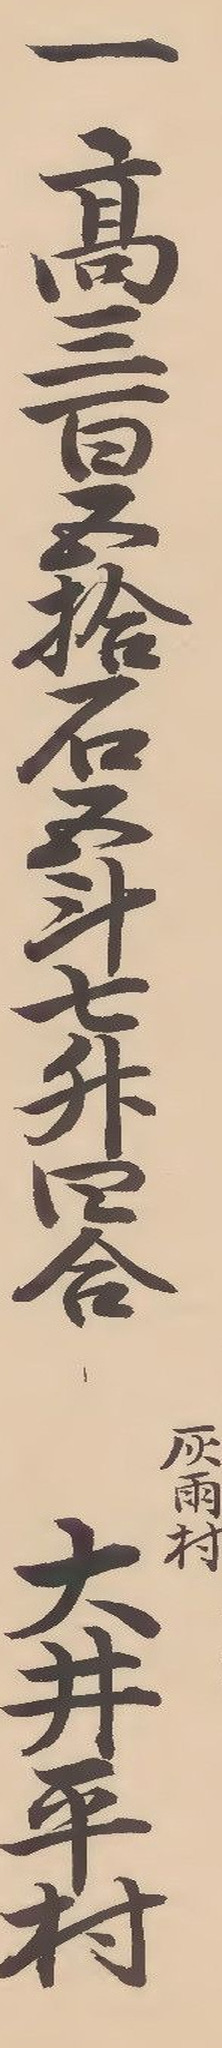一高三百五拾石五斗七升四合大井平村
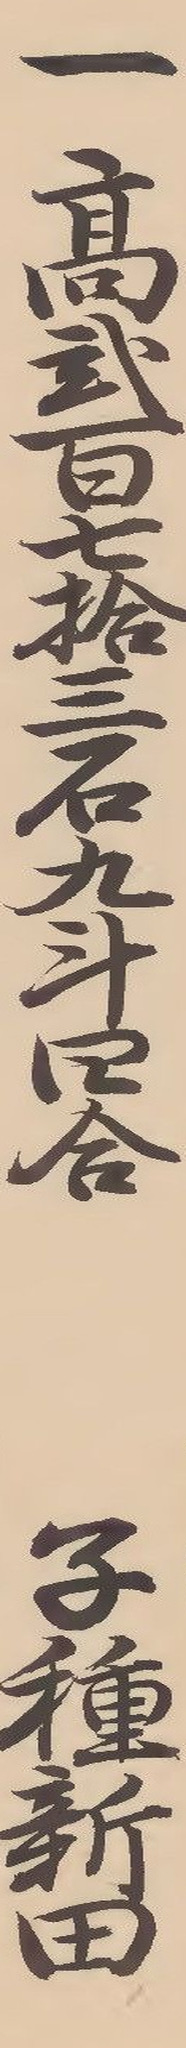一高弐百七拾三石九斗四合子種新田
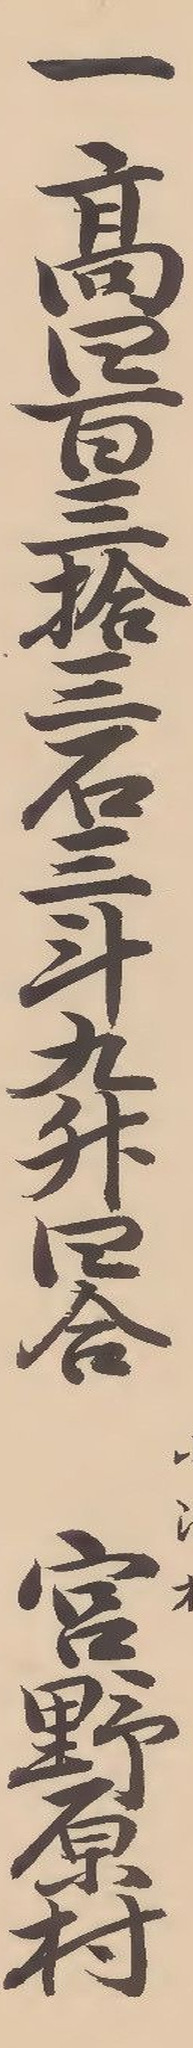一高四百三拾三石三斗九升四合宮野原村
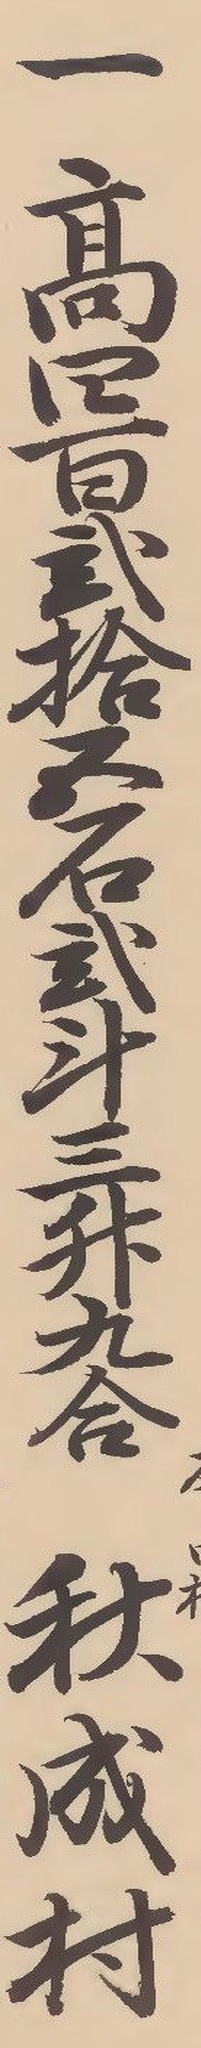一高四百弐拾五石弐斗三升九合秋成村
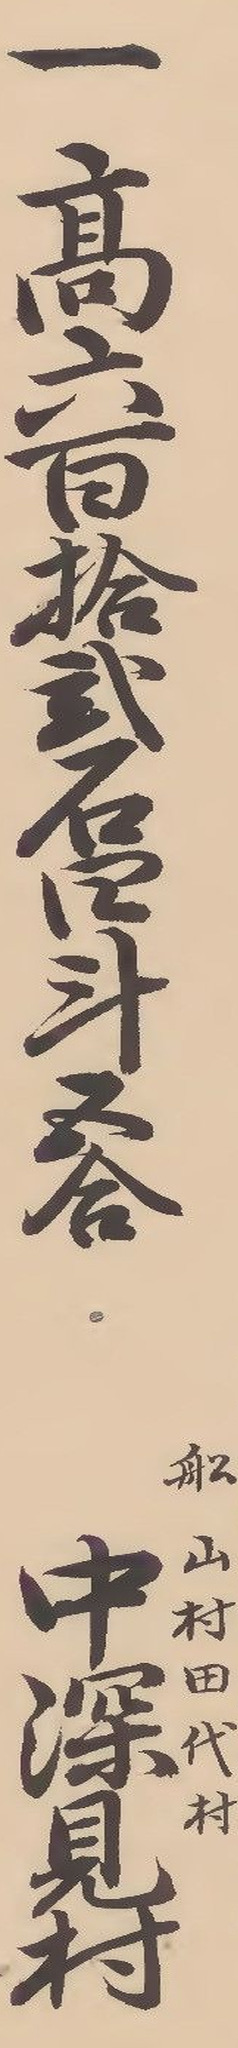一高六百拾弐石四斗五合中深見村

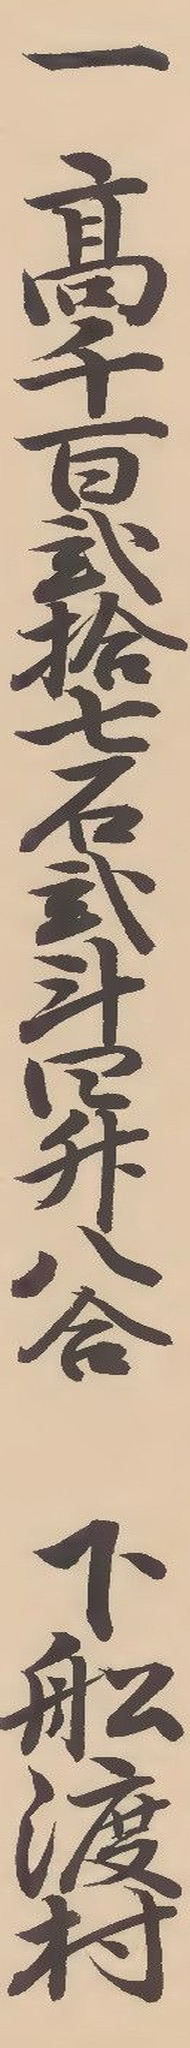一高千百弐拾七石弐斗四升八合下船渡村
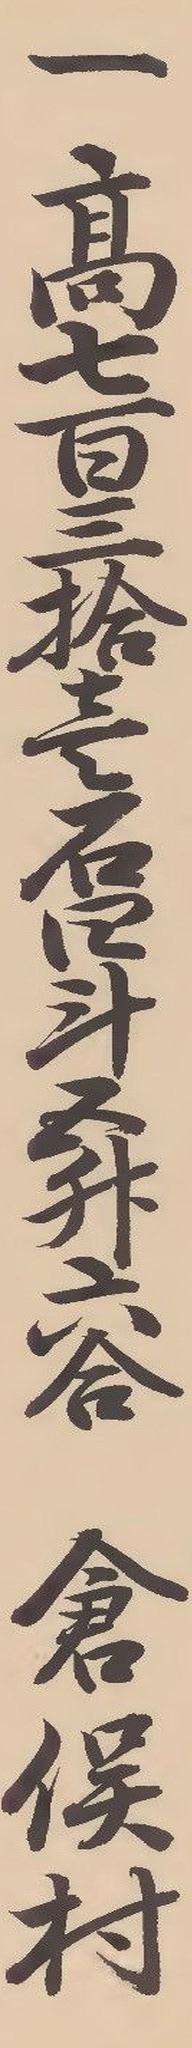一高七百三拾壱石四斗五升六合倉俣村
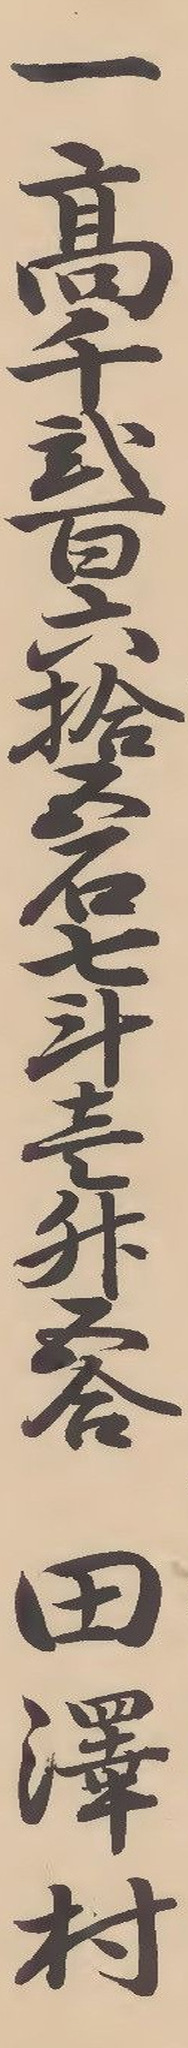一高千弐百六拾五石七斗壱升五合田沢村
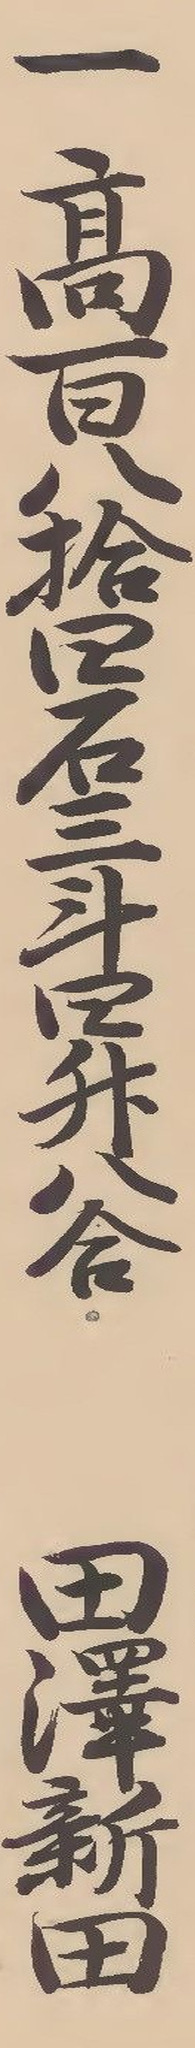一高百八拾四石三斗四升八合田沢新田

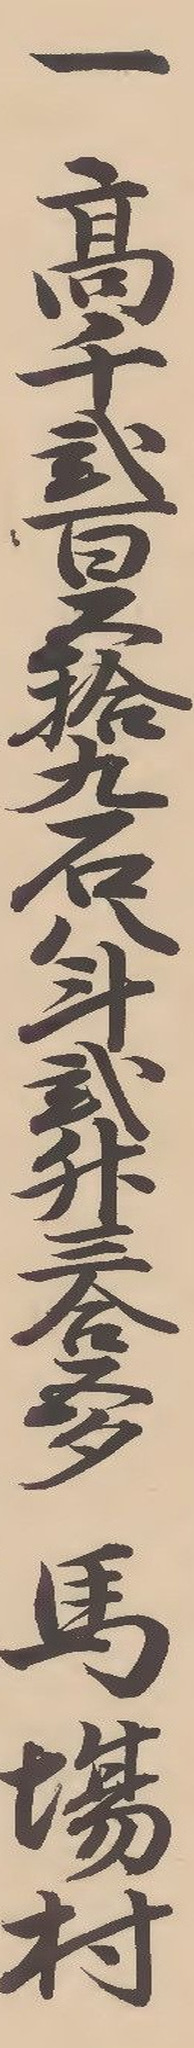一高千弐百五拾九石八斗弐升三合五勺馬場村
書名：越後国郷帳　中
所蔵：国立公文書館 National Archives of Japan
